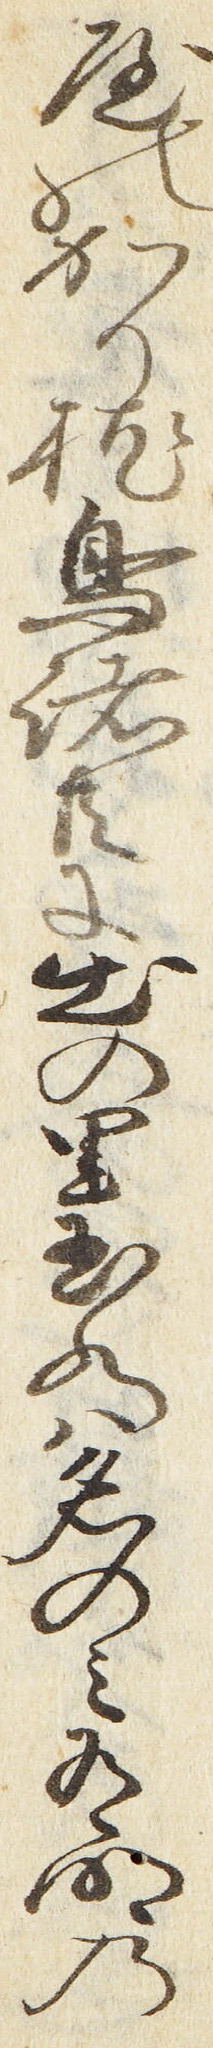屋のかり枕鳥諸共に出の里玉水は名のみ有明の

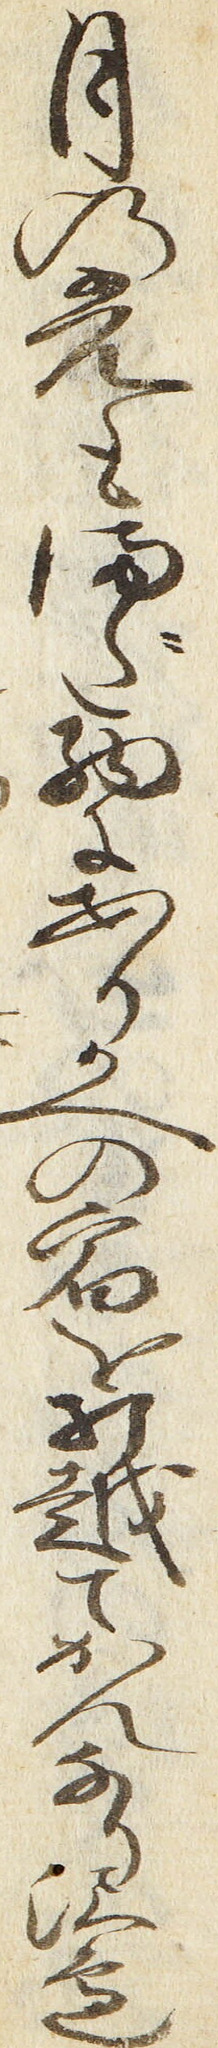月の光もまだ西にありかへの宿を打越てかんなり沢辺
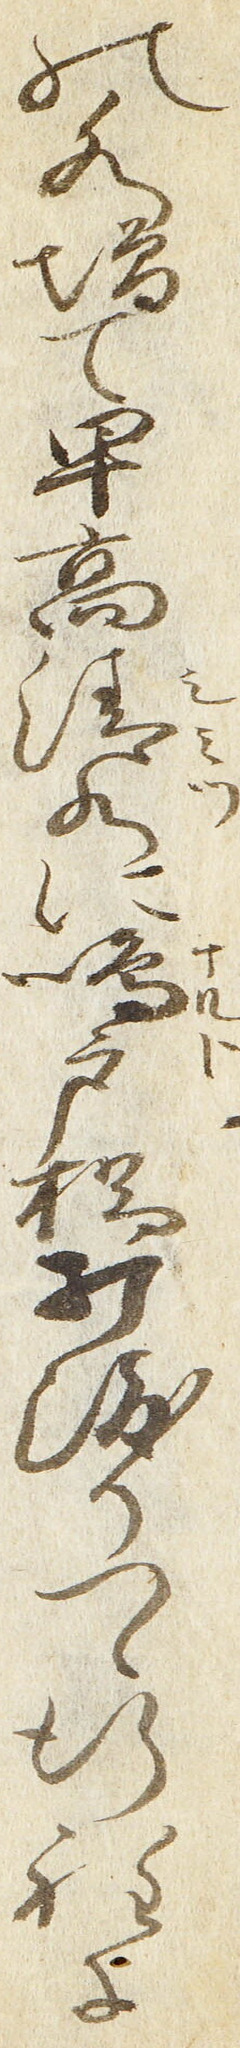の水増て早高清水に鳴戸橋打渡りつゝ行程に
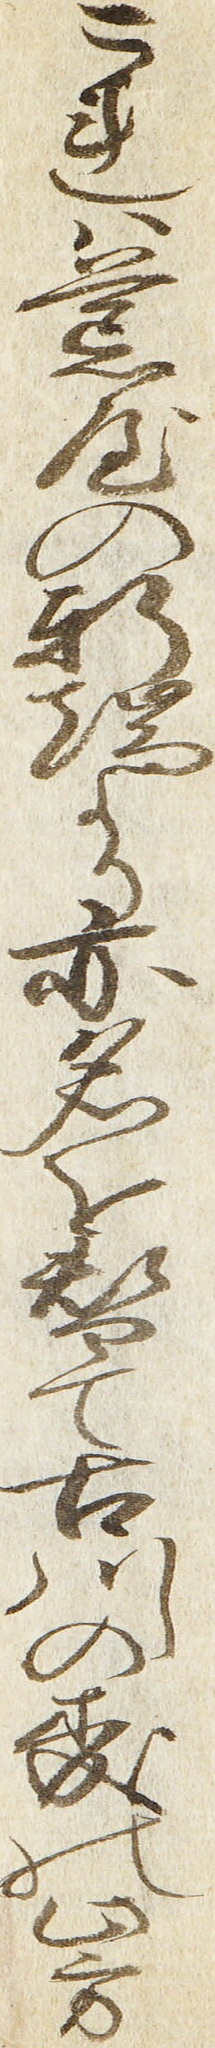これハ荒屋の軒端より亦名を替て古川の森の此方
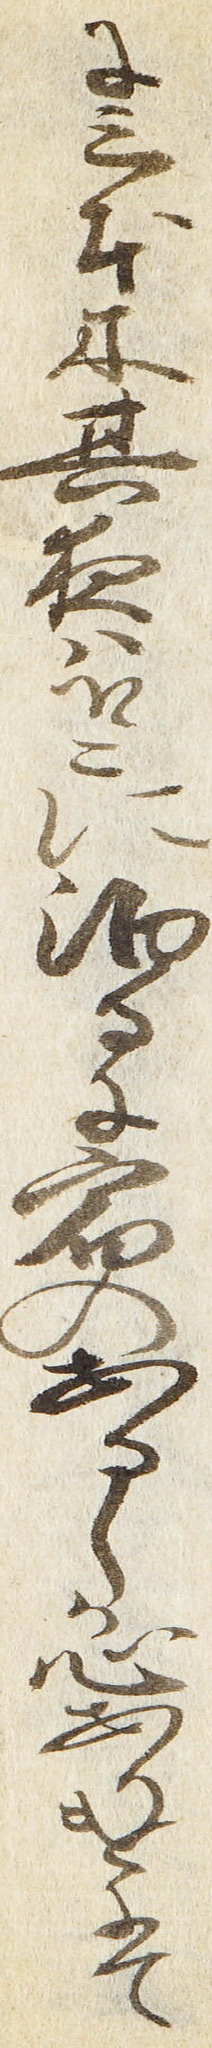に三本木其夜はそこに泊るに宿のあるしか心ありけにて
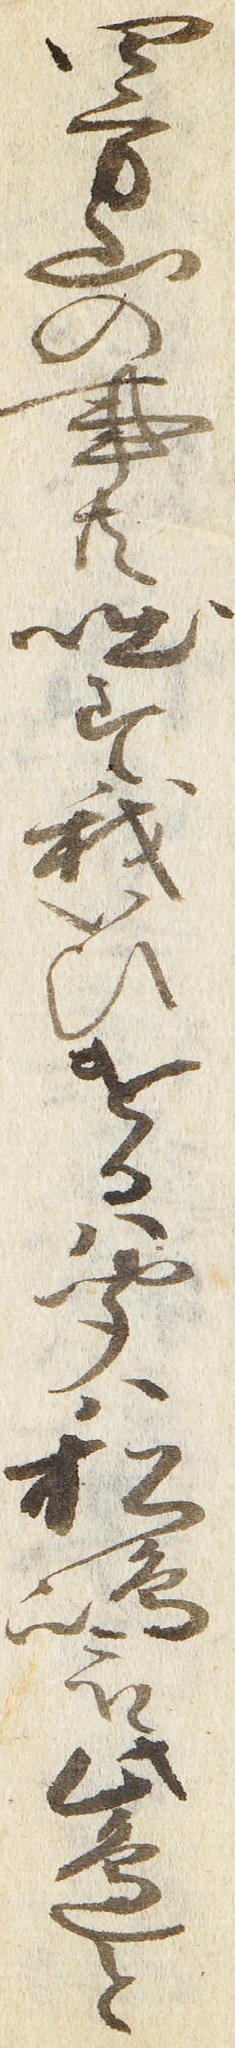四方山の事共咄す我いひけるは聞は松嶋こそ此辺と
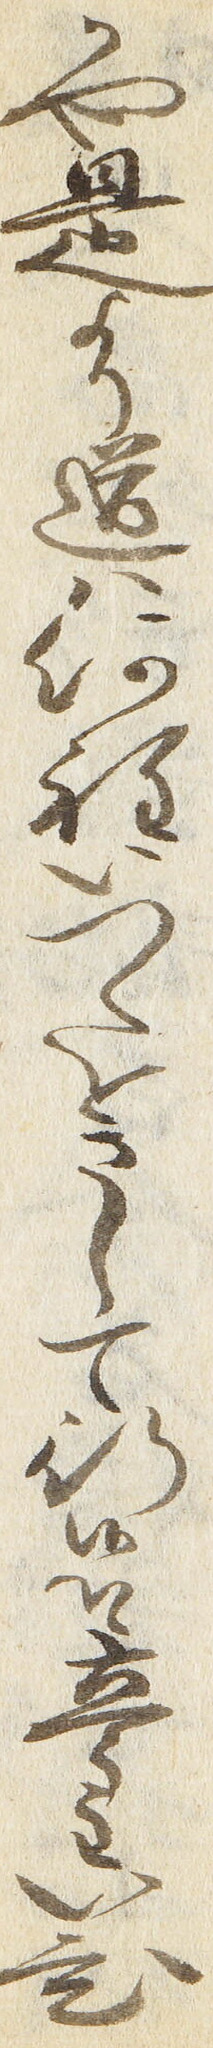かや是より道は何程いつくをさして行候そ亭主いひ
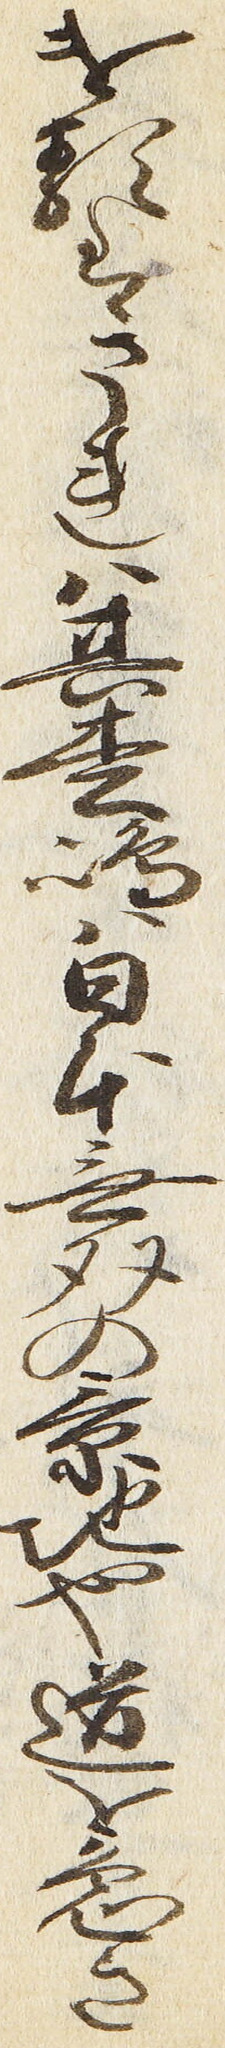けるはされは其松嶋は日本無双の景地也道を急き
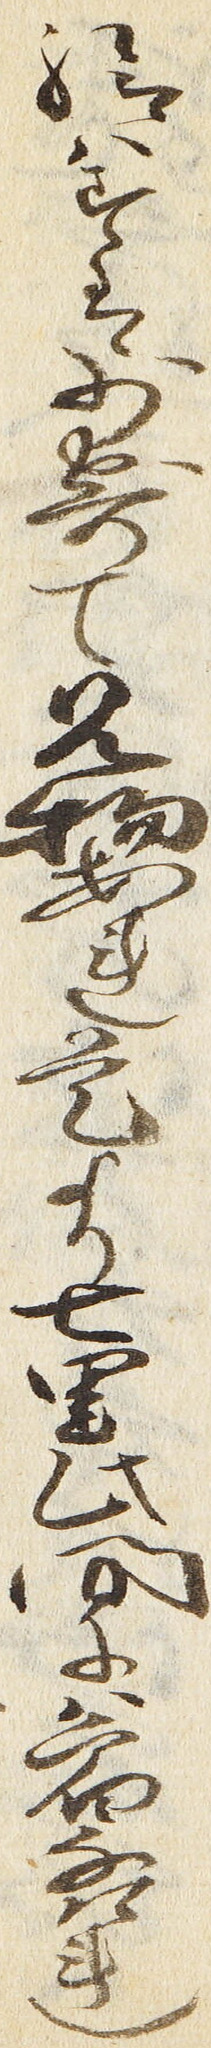給はすは少寄て見物あれ是より七里此間には宿なけれ
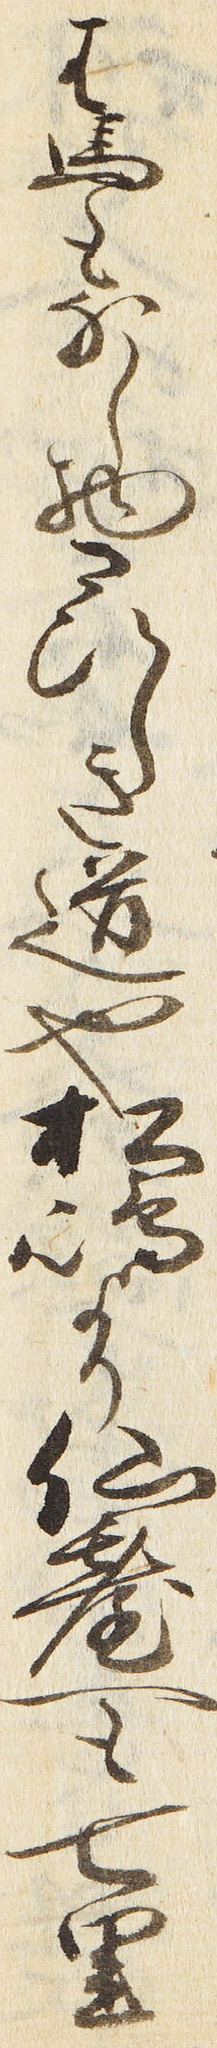は馬もなし物さひしき道也松嶋より仙台へも七里
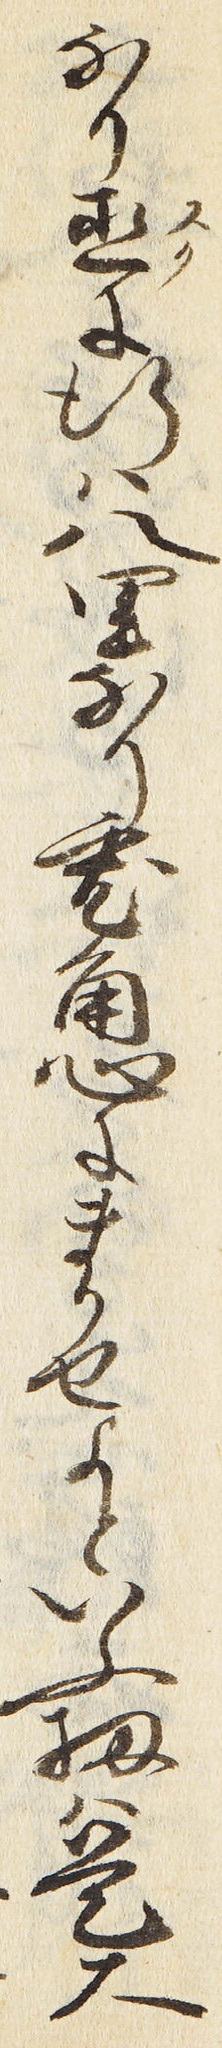なり直に行は八里なり兎角心にまかせよといふ扨は是大
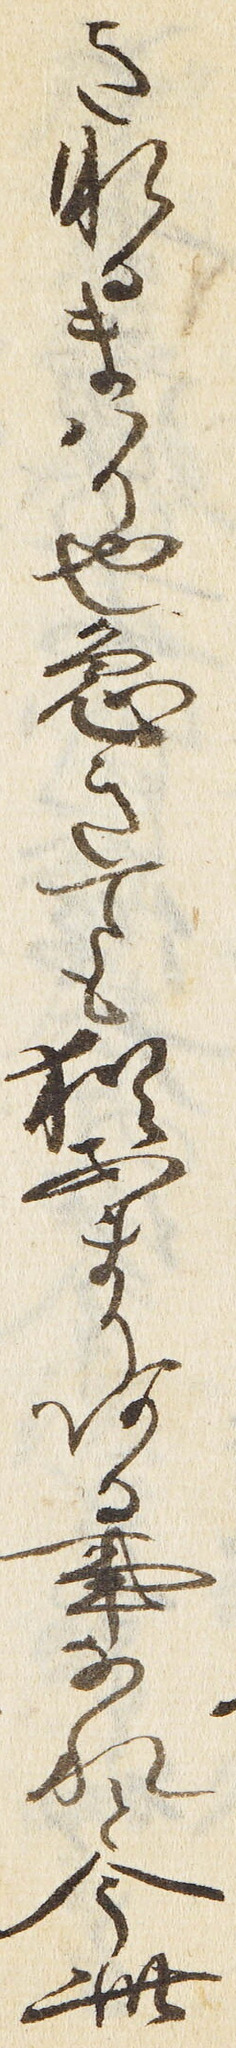きなるまはり也急きても猶あまりある事なれと今此
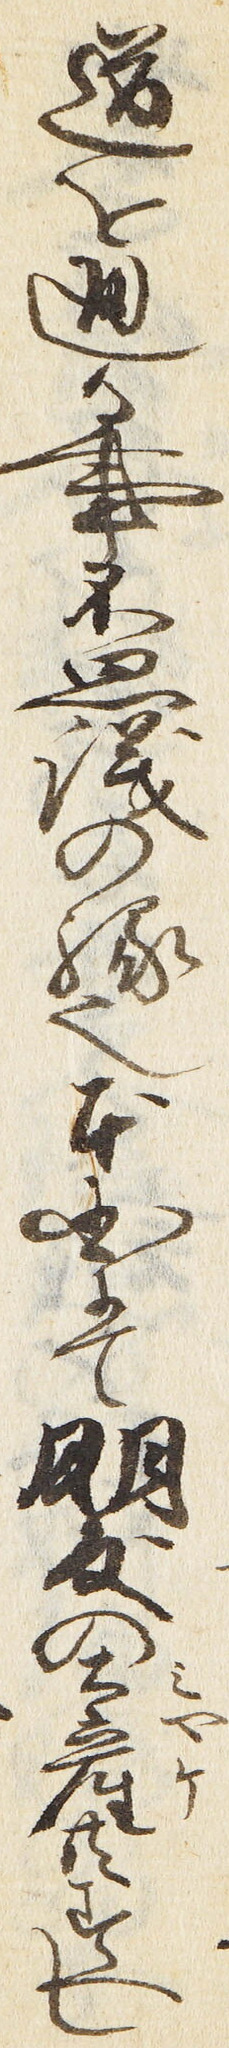道を通る事不思議の縁也本国にて朋友の土産共すへし
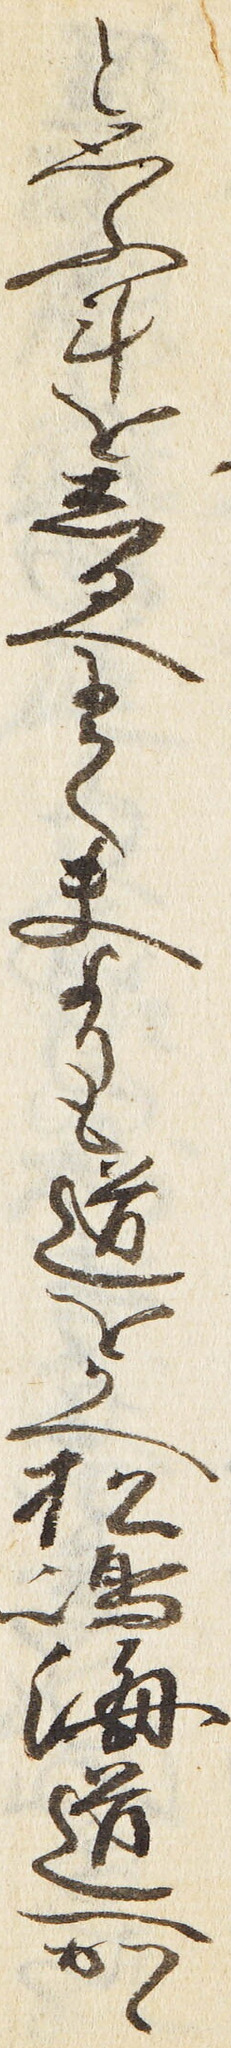と思ふ計をしるへにて夫よりも道をかへ松嶋海道へかゝ
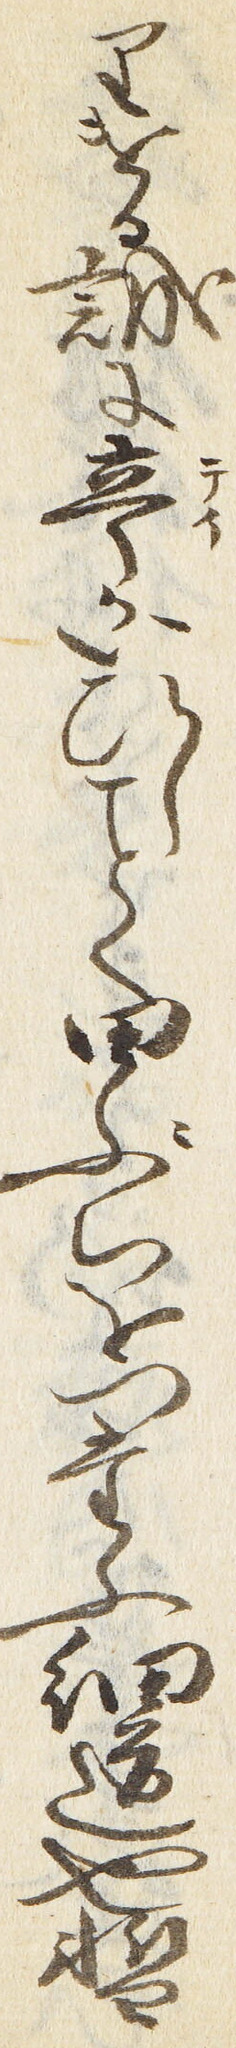りける誠に亭かいひしことく田ぶちをつたふ細道也暫
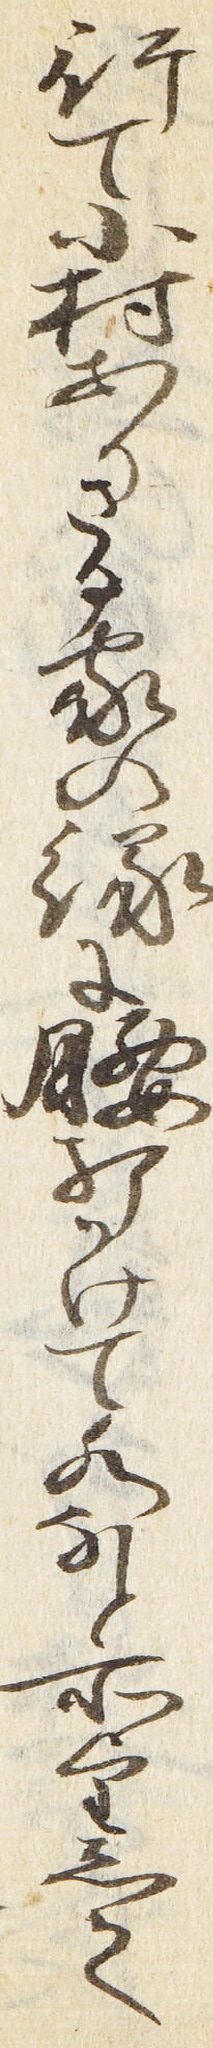行て小村ありさる家の縁に腰打かけて水なと所望して
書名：海陸世話日記
